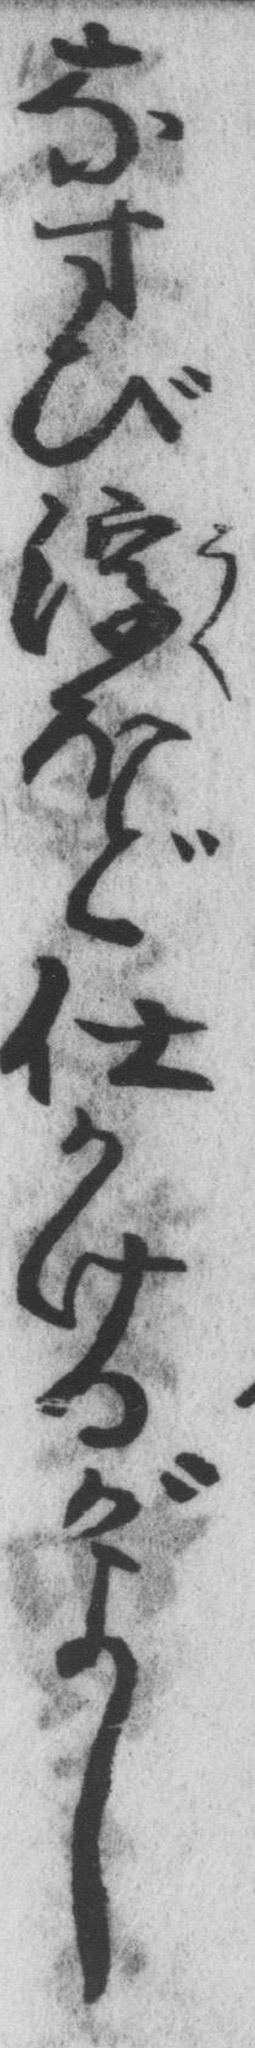なすび浮ほど仕かけるがよし
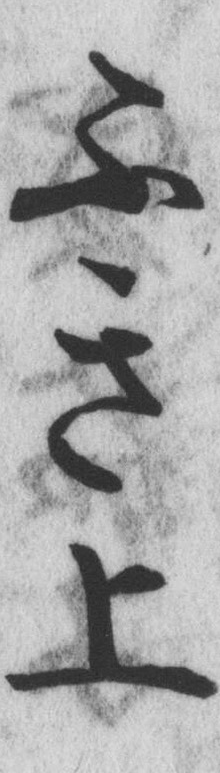ふき上
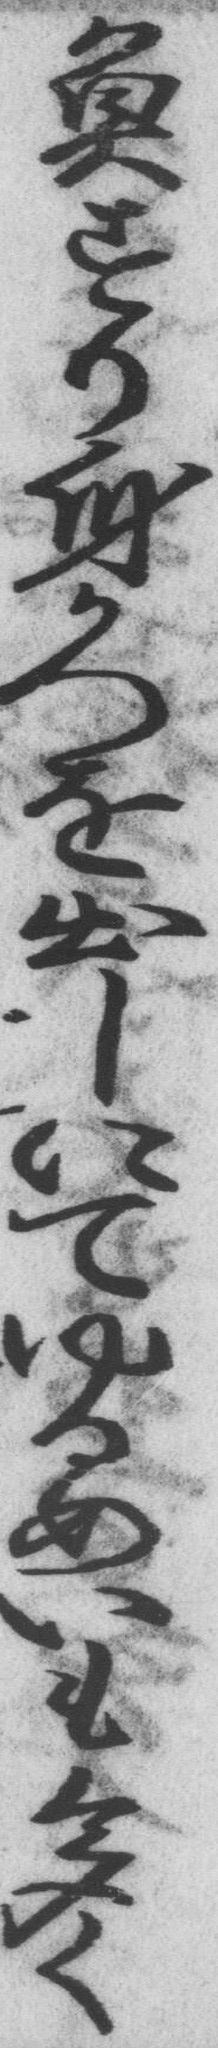魚すり身かつを出しにてゆるめいも多く
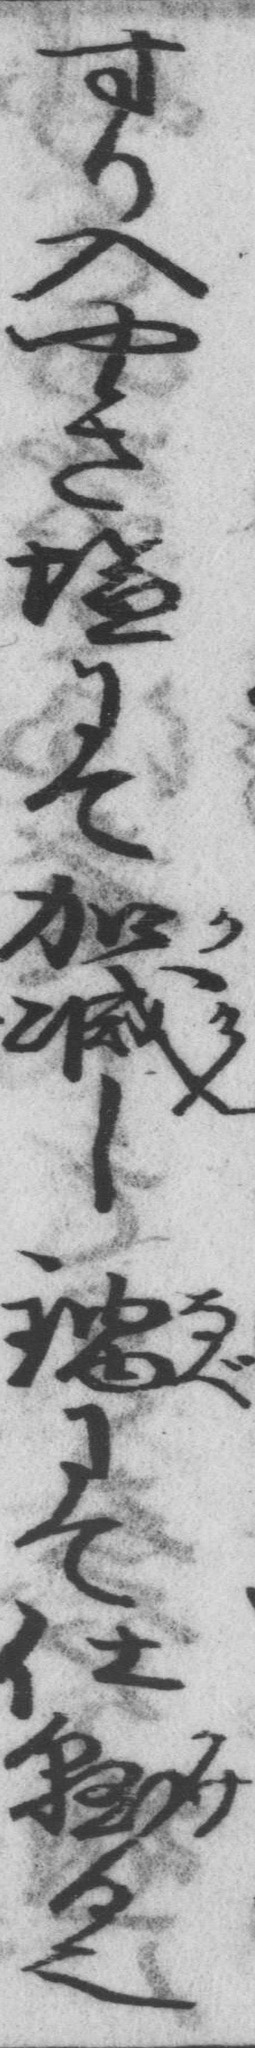すり入やき塩にて加減し鍋にて仕懸る也
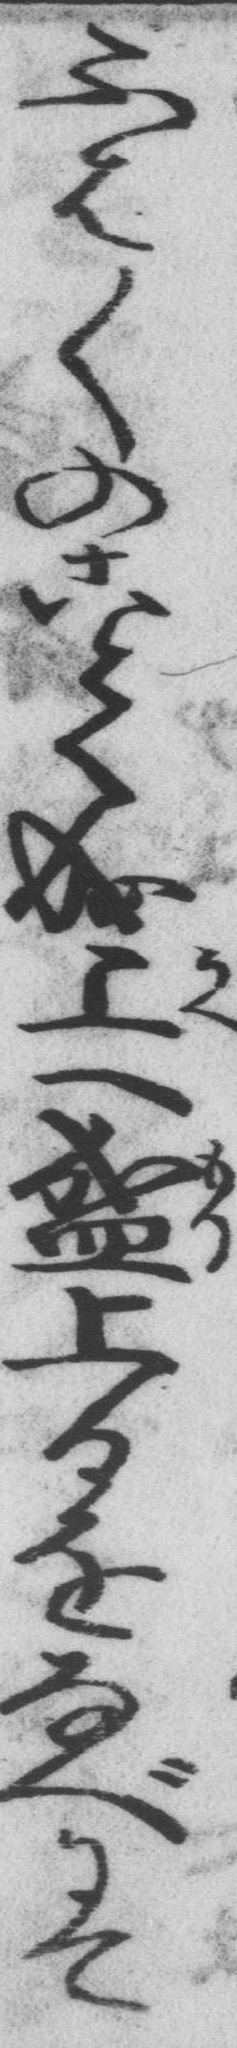ふは〳〵のことく成上へ盛上るをなべにて
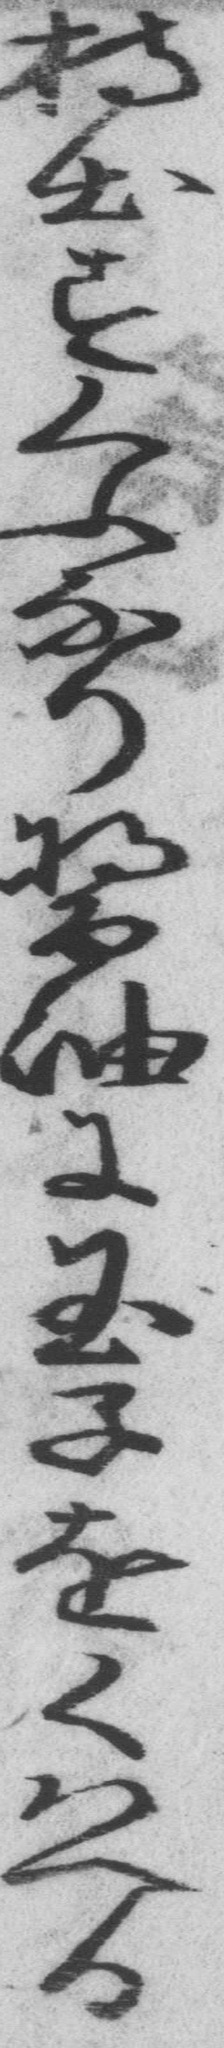持出すくふなり醤油に玉子をくはへる
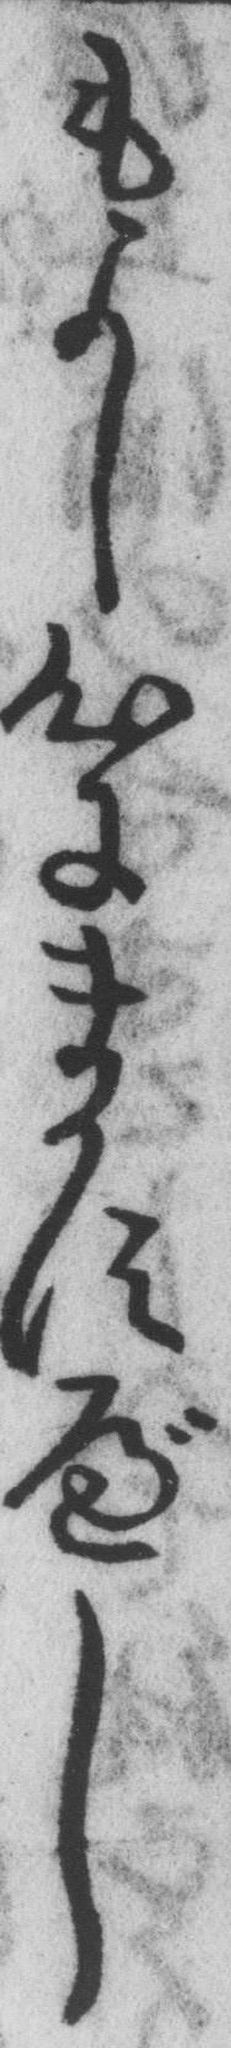もよし心にまかすべし
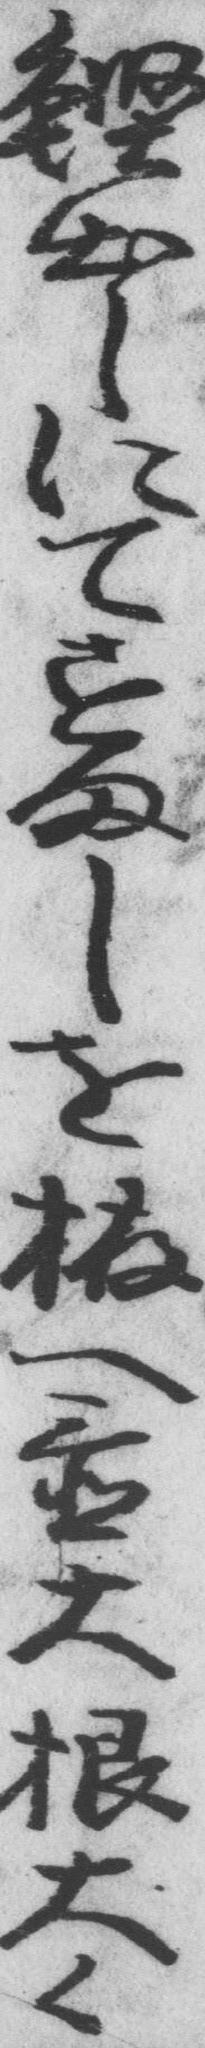鰹出しにてすましを拵へ置大根大く
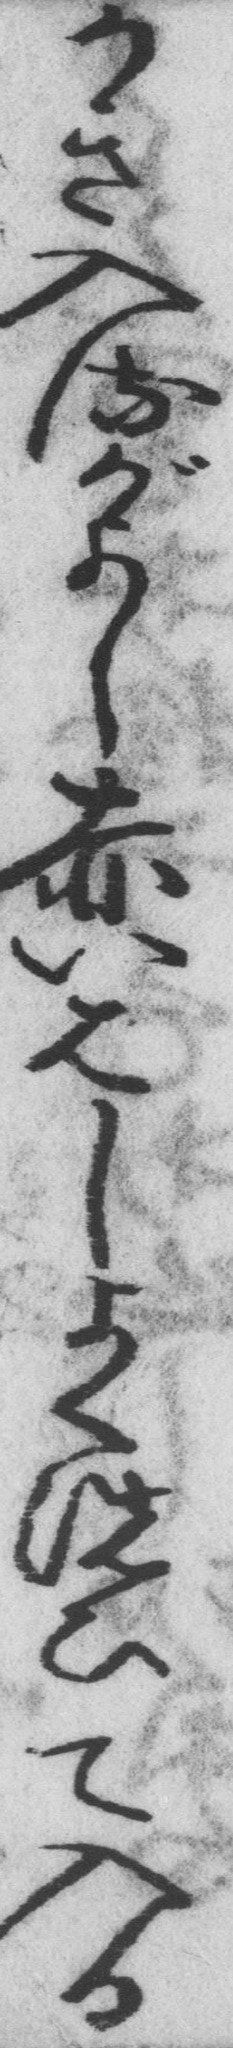かき入るがよし赤いはしよく洗ひて入る
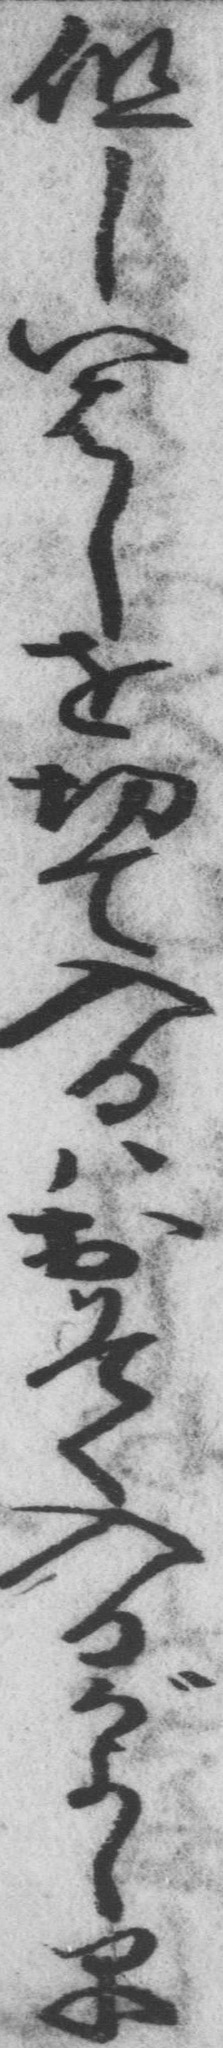但しいはしを切て入るはおそく入るがよし早
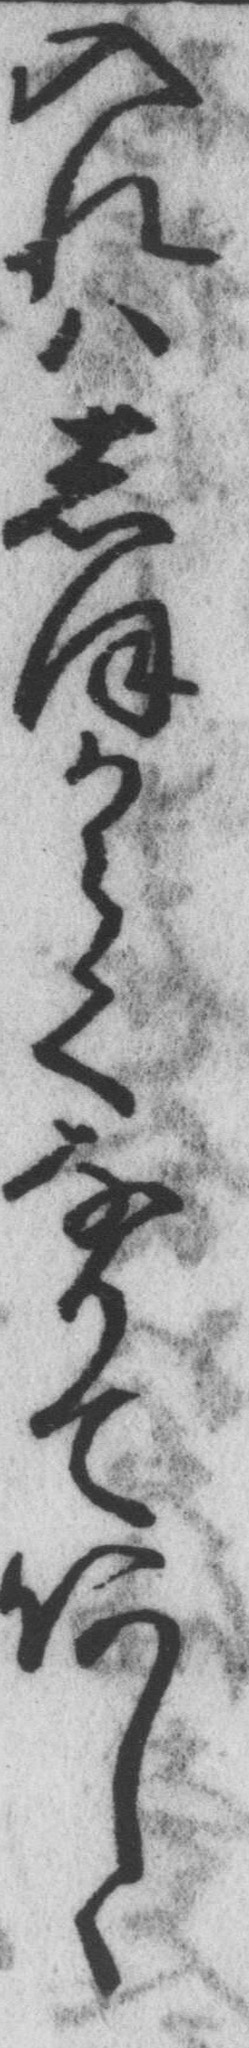入れはしほからくなりてあしく

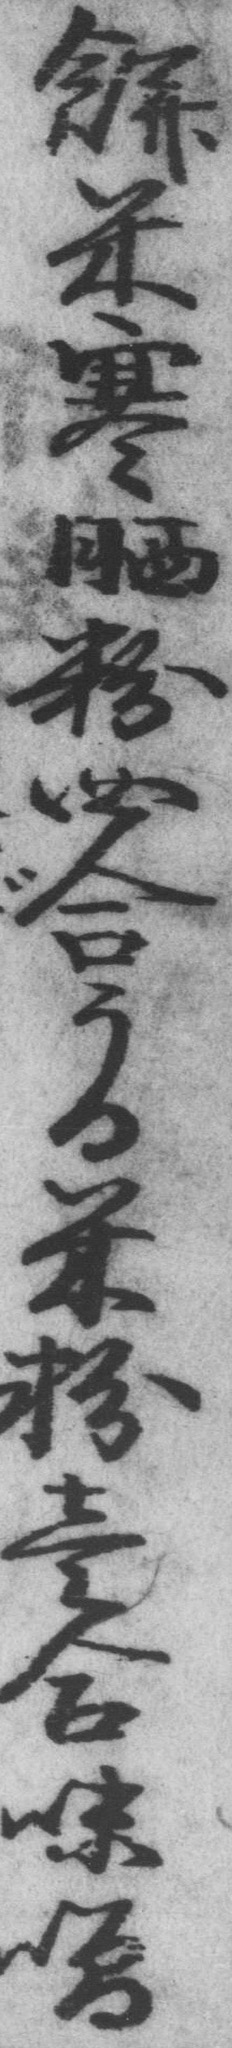餅米寒晒粉四合うる米粉壱合味噌
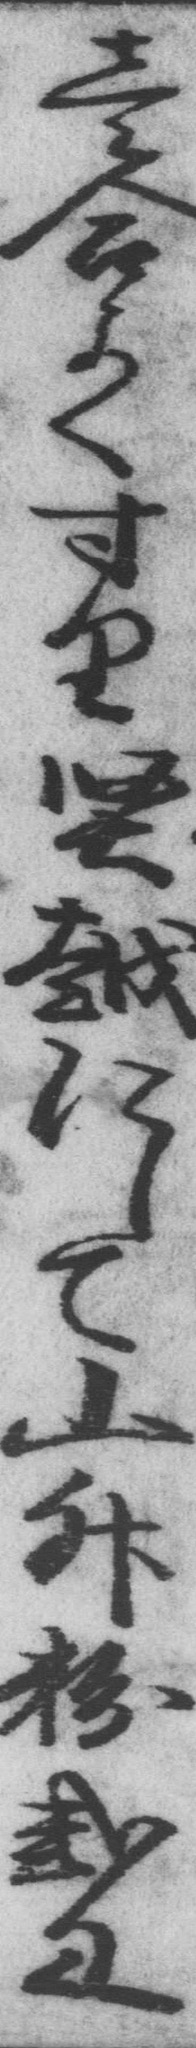壱合よくすり堅越にして山升粉弐匁
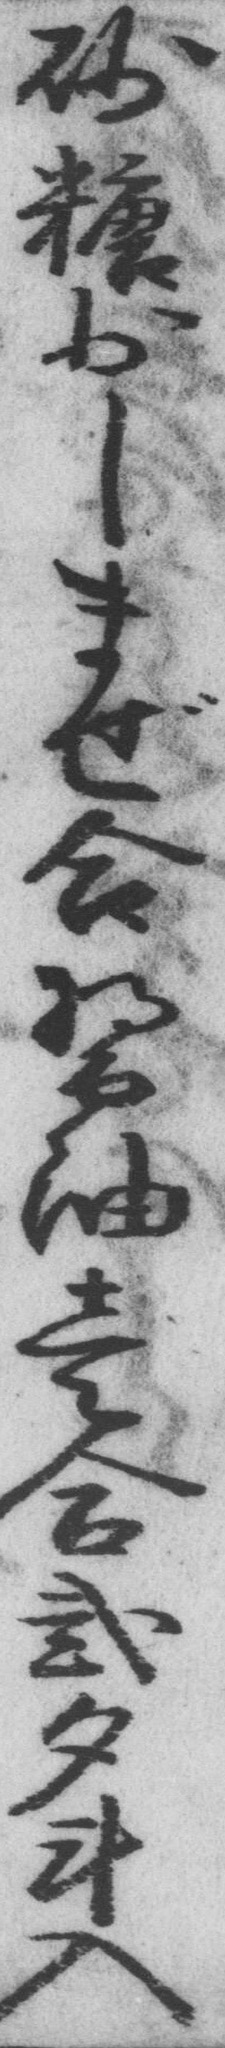砂糖少しまぜ合醤油壱合弐勺斗入
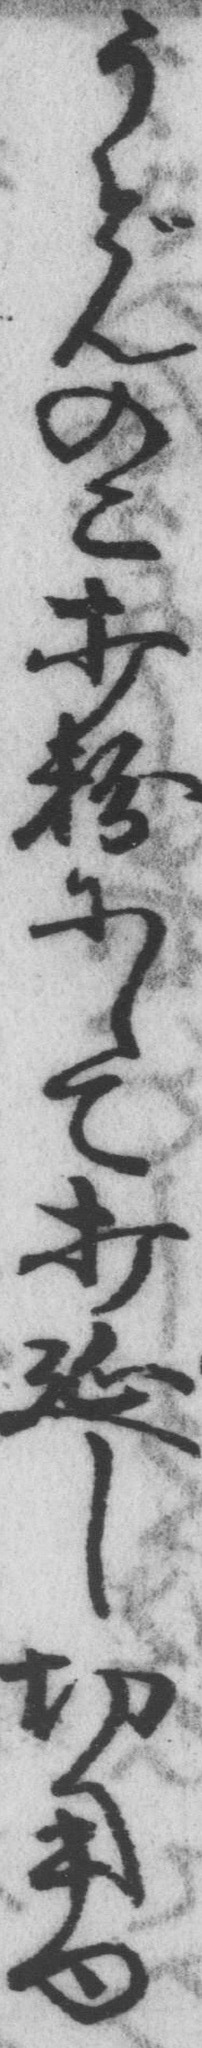うどんのこ打粉にして打延し切用ゆ
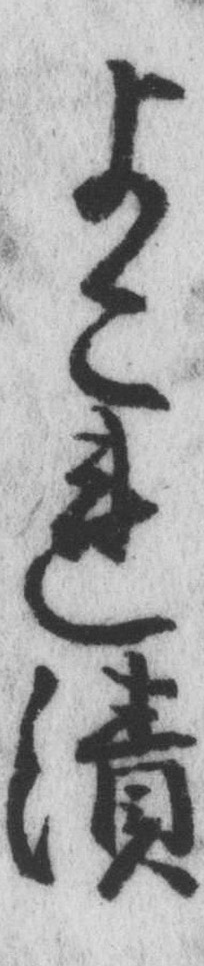よこれ漬
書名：料理山海郷
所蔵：大阪府立大学学術情報センター 国文学研究資料館
